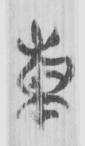柬
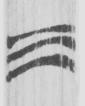三
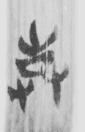束
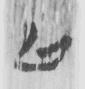㠯（以）
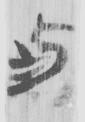此
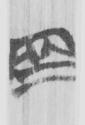兩
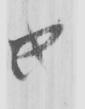女
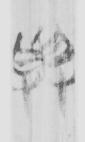與
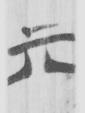亓
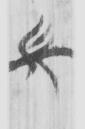𡵂
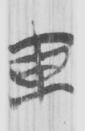車
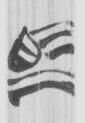馬
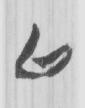㠯（以）
